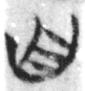自
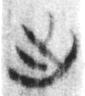出
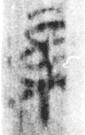福
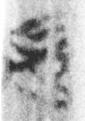是
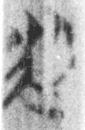從
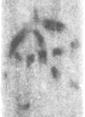内
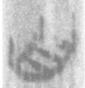自
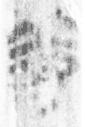悲
